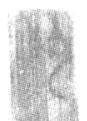妁
